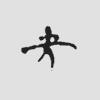无
